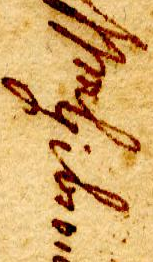W^m Gibson
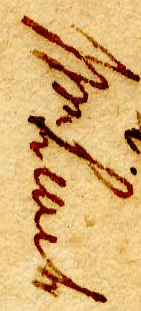W^m Leach
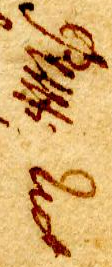Pllll Rect
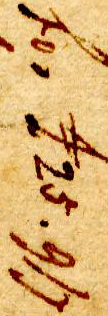for £25. 9s7
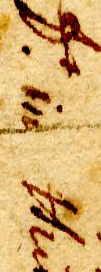D^o. in this
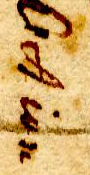Action
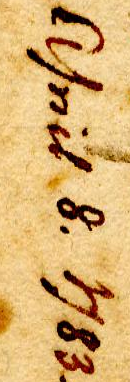April 8. 1783.
